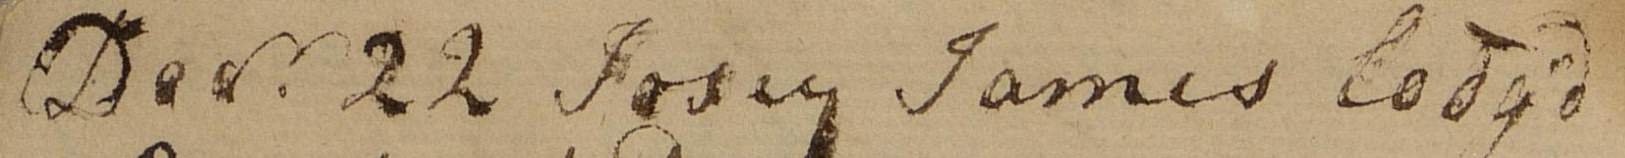Dec^r. 22 Josey James lodg'd
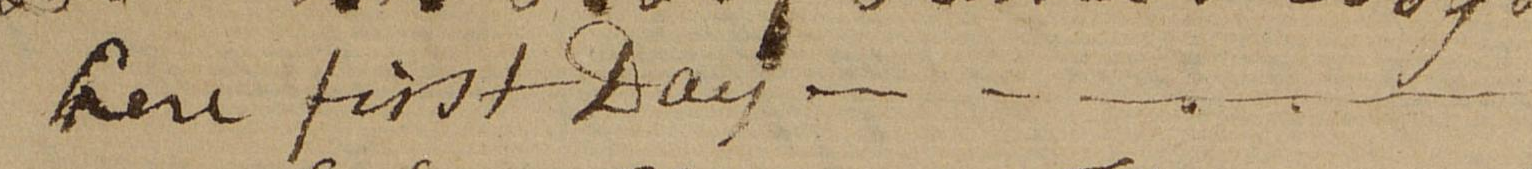here first Day-----
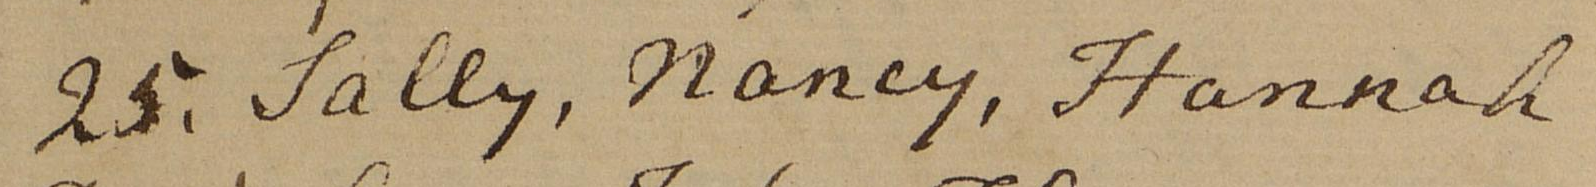25. Sally, Nancy, Hannah
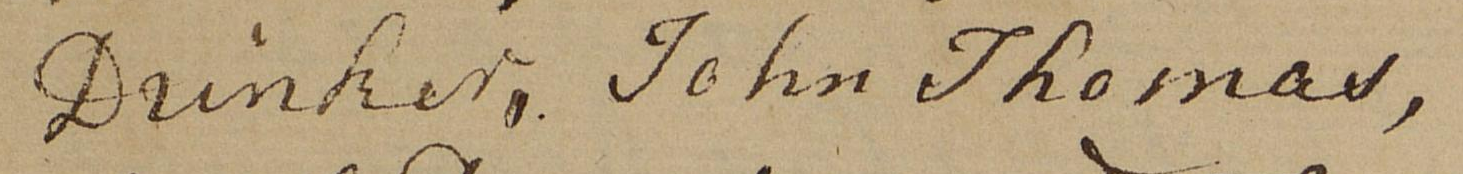Drinker, John Thomas,
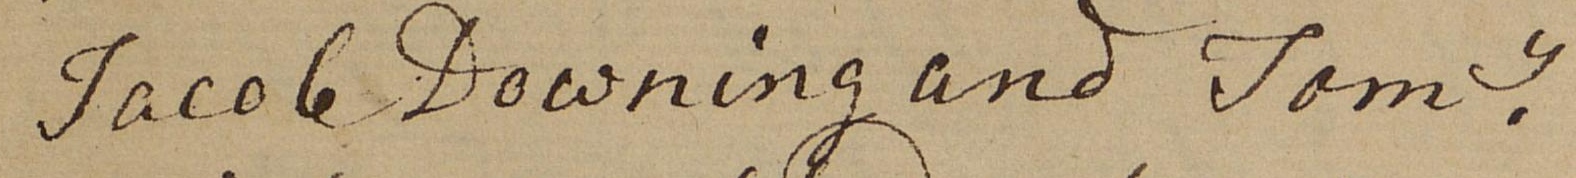Jacob Downing and Tom^y.
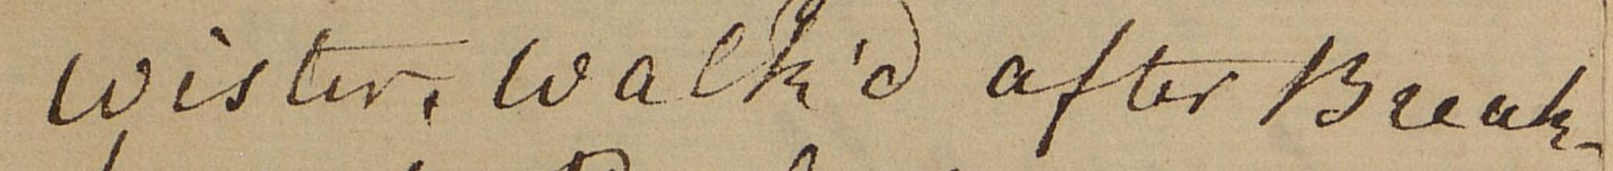Wister, walk'd after Break-
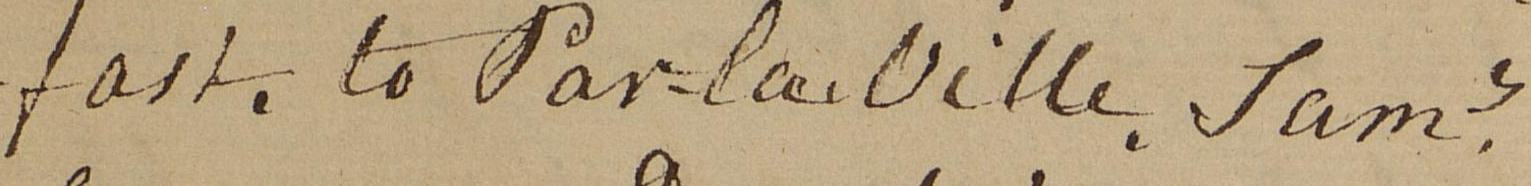-fast, to Par-laVille Sam^y.
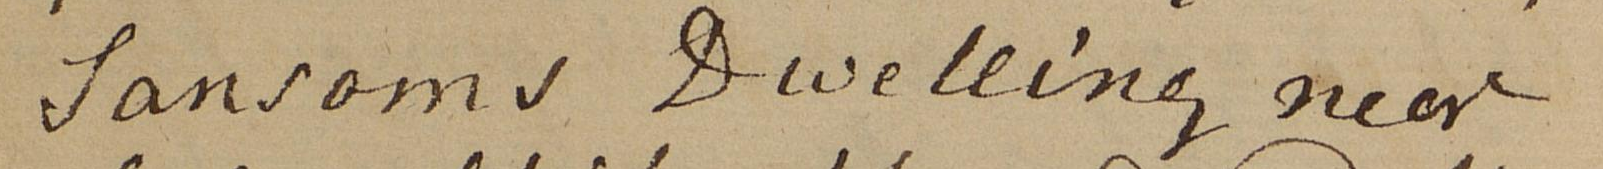Sansoms Dwelling near
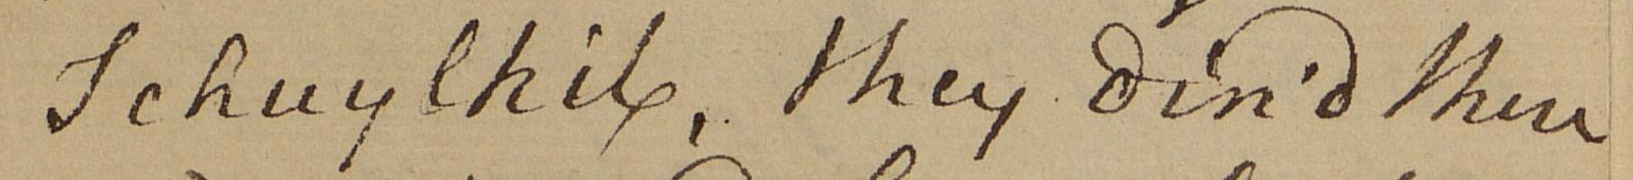Schuylkil, they din'd there
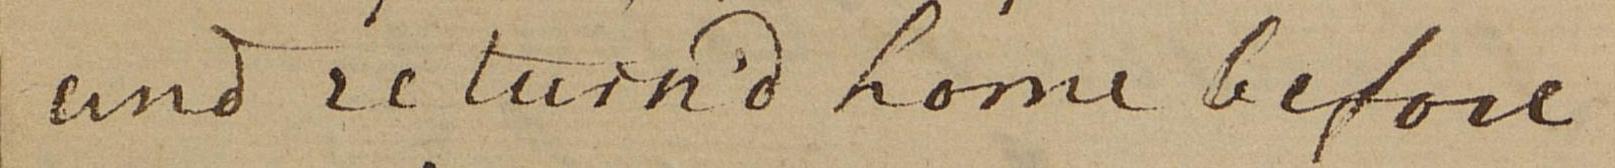and re turn'd home before
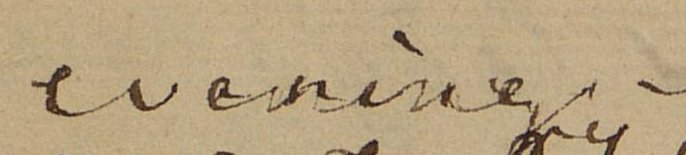evening-
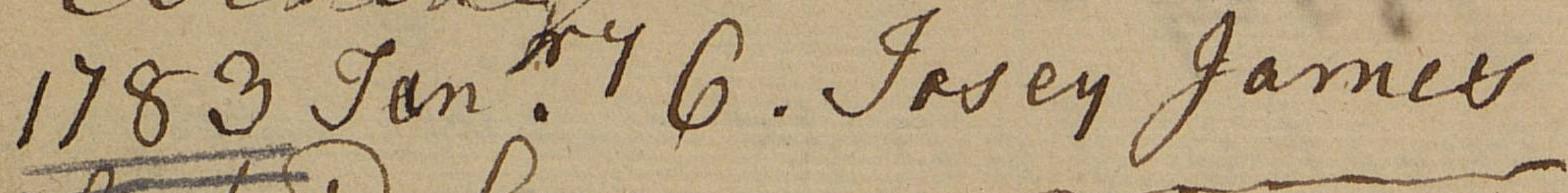1783 Jan^ry. 6. Josey James
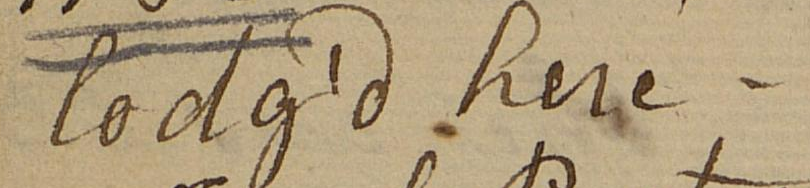lodg'd here-
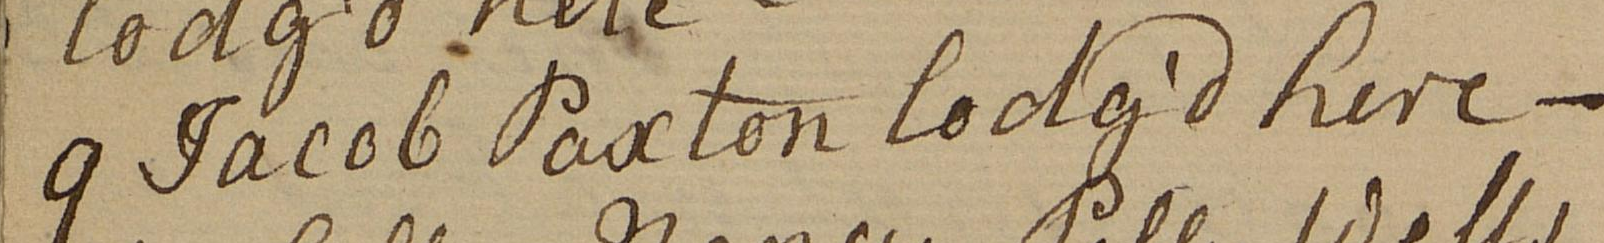9 Jacob Paxton lodg'd here-
